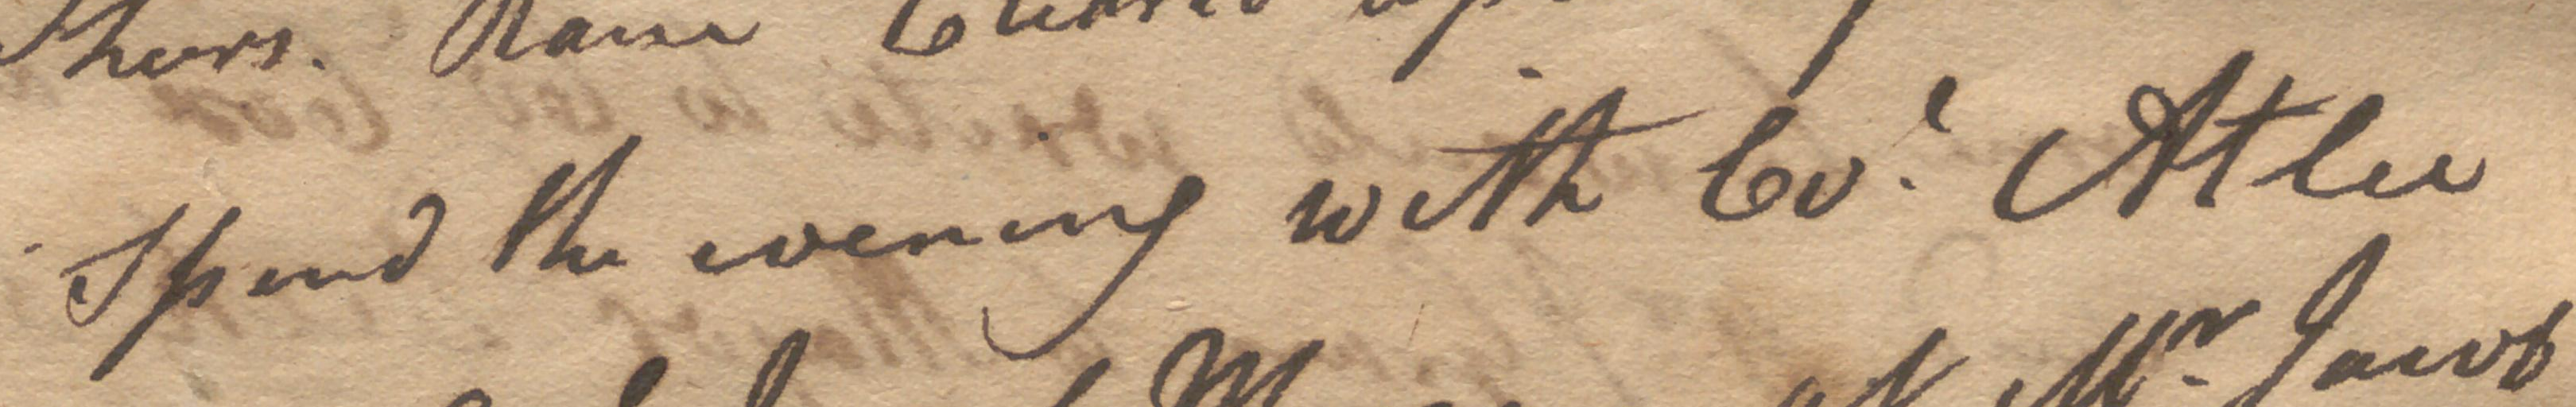spend the evening with Co^l. Atlee
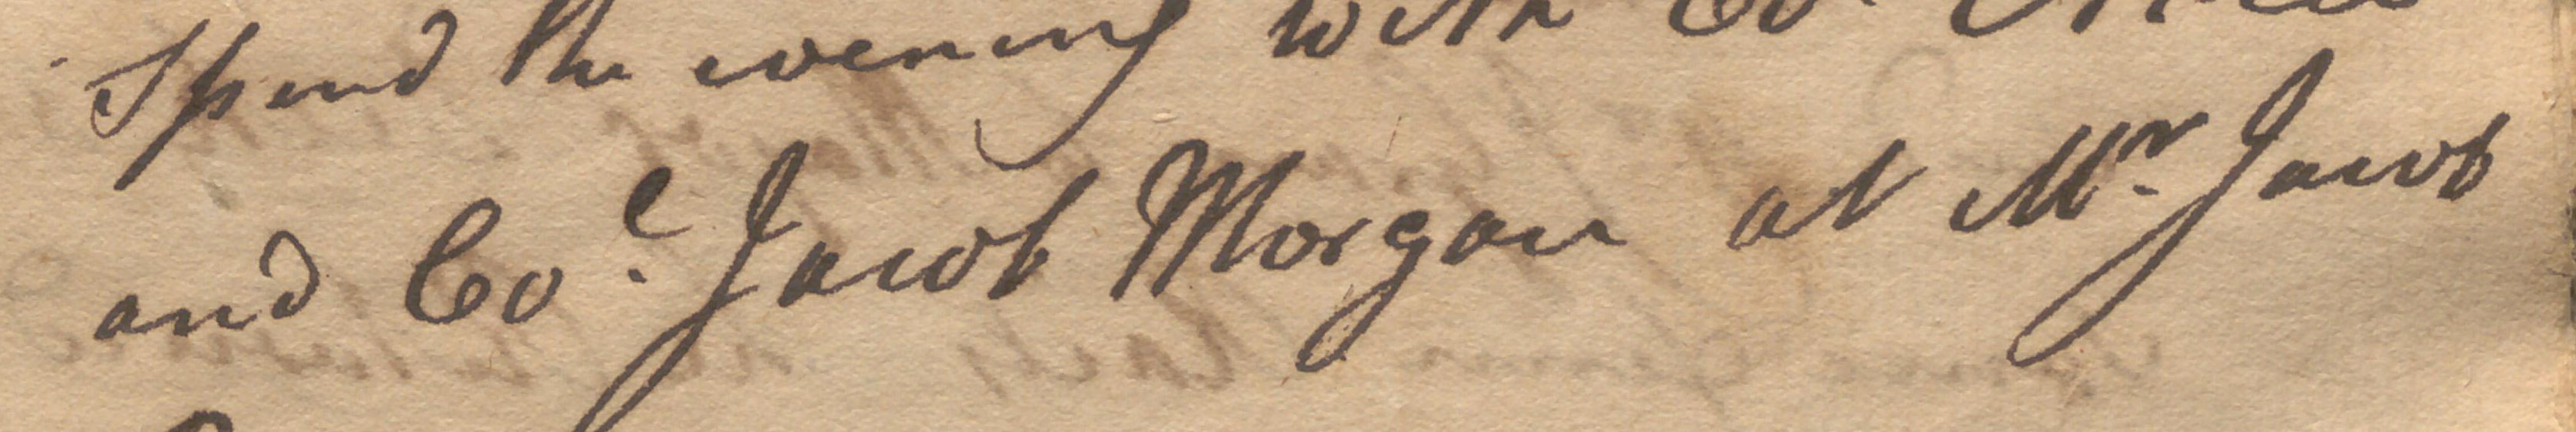and Co^l. Jacob Morgan at M^r. Jacob
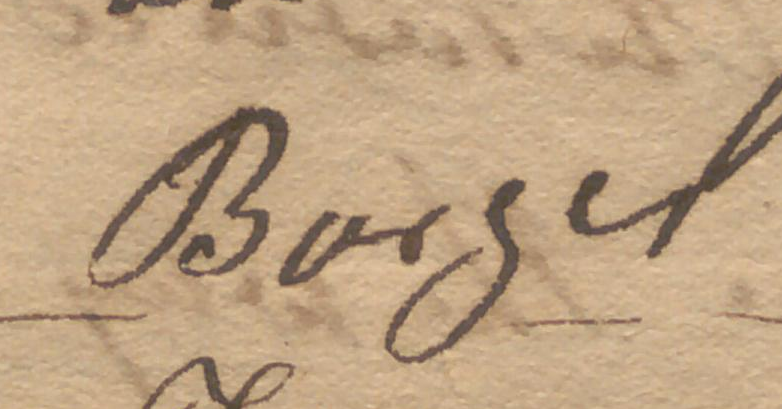Barges
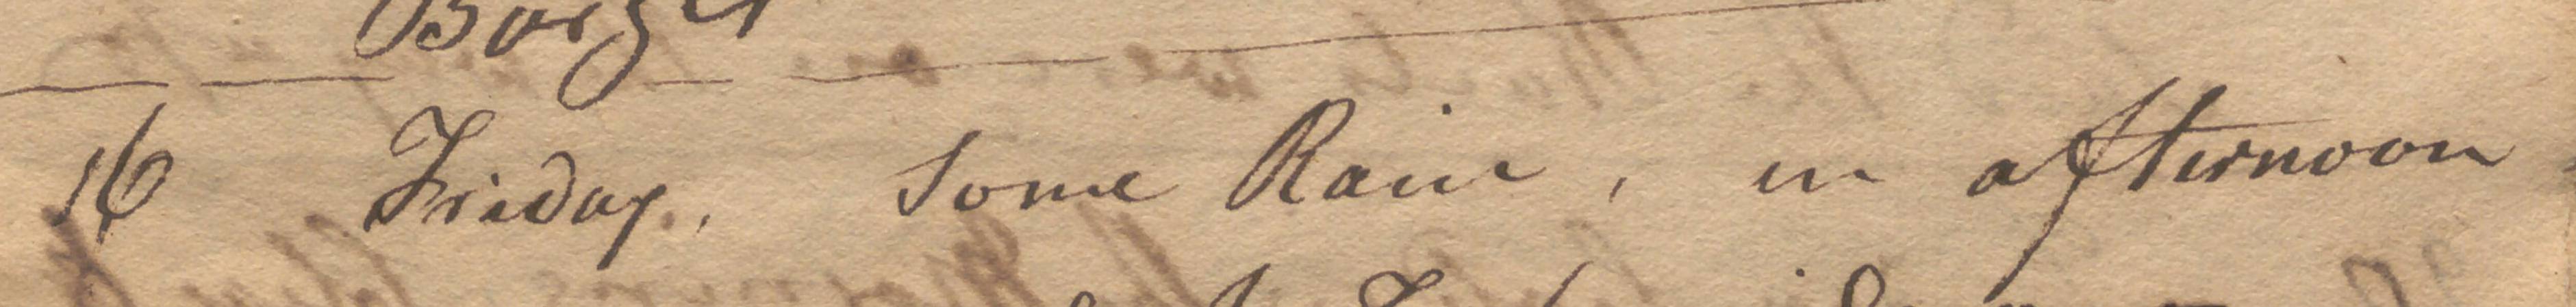16 Friday. Some Rain, in afternoon
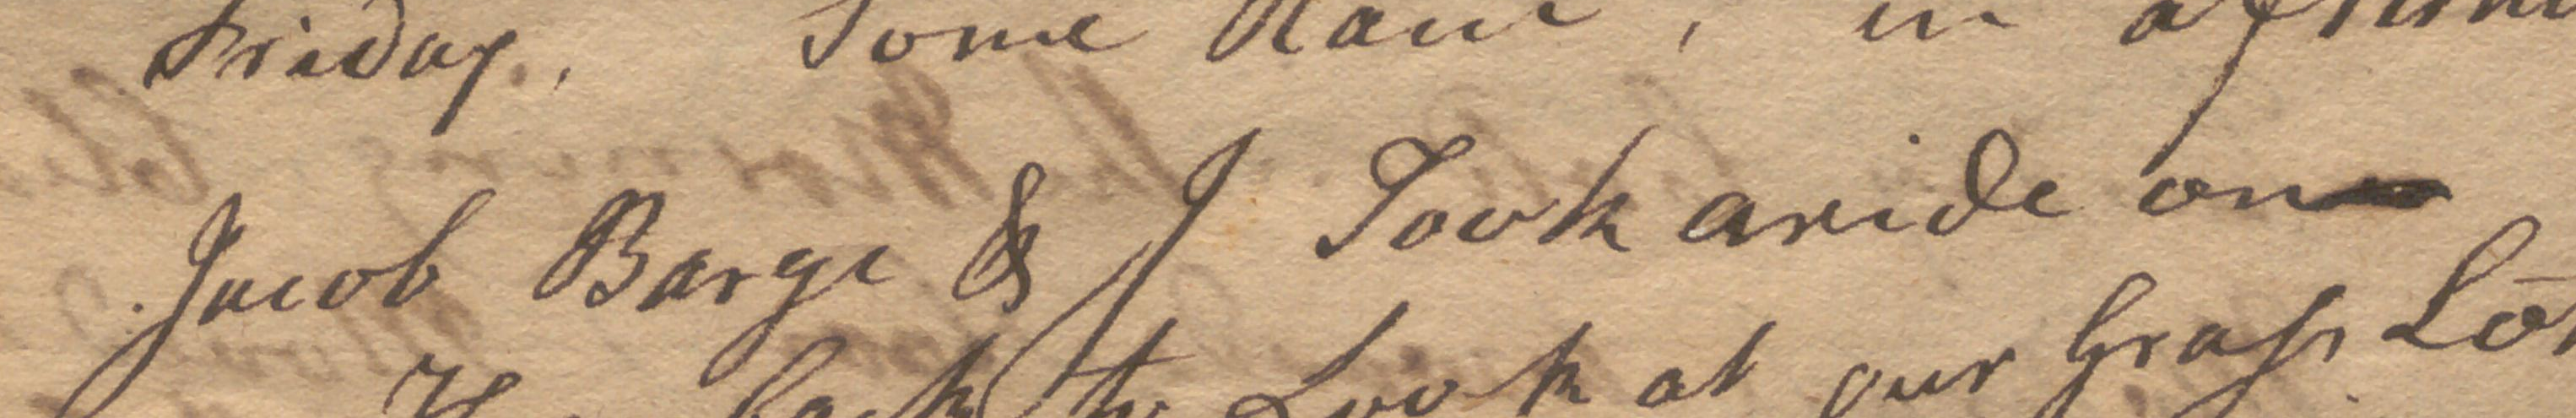Jacob Barge & I Took a ride on[_]
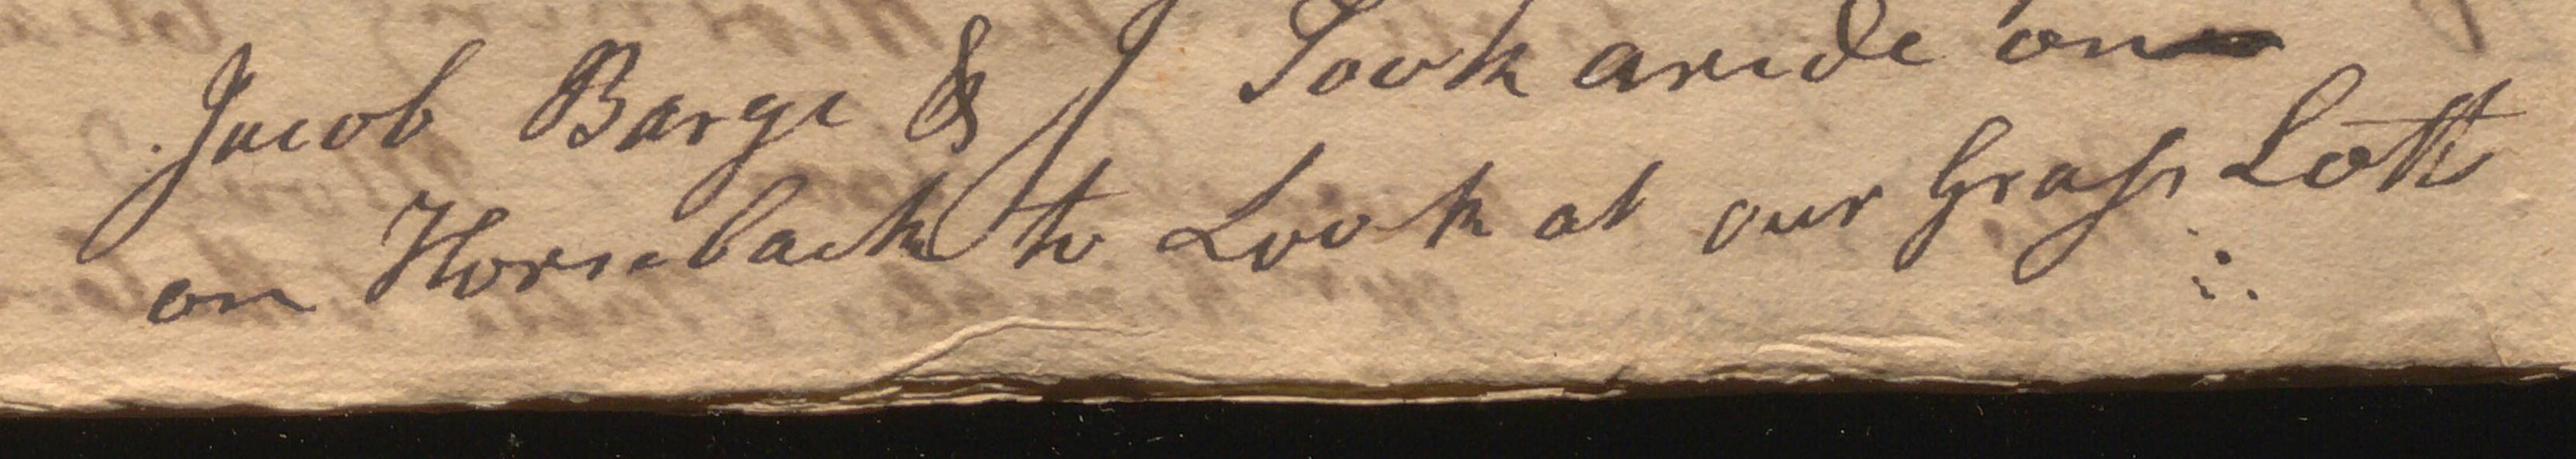on Horse back to Look at our Grass Lotts
